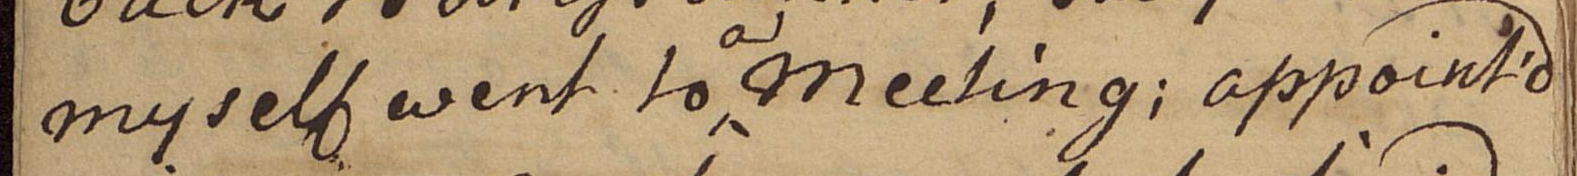myself went to ^a Meeting; appoint'd
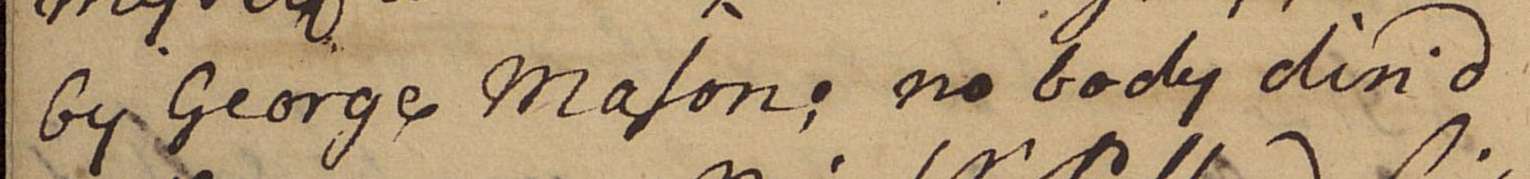by George Mason; no body din'd
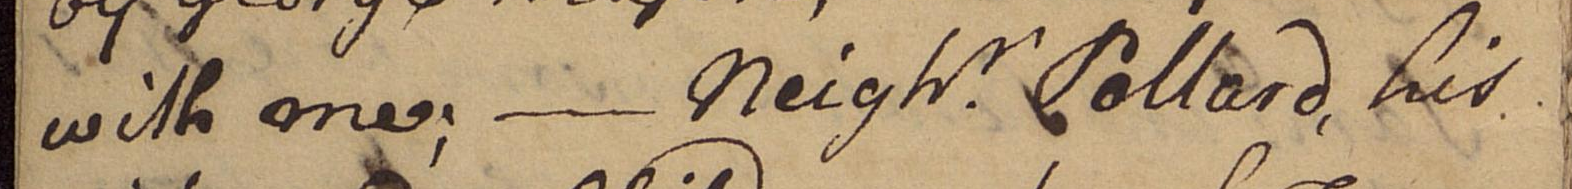with me;- Neigh^r Pollard, his
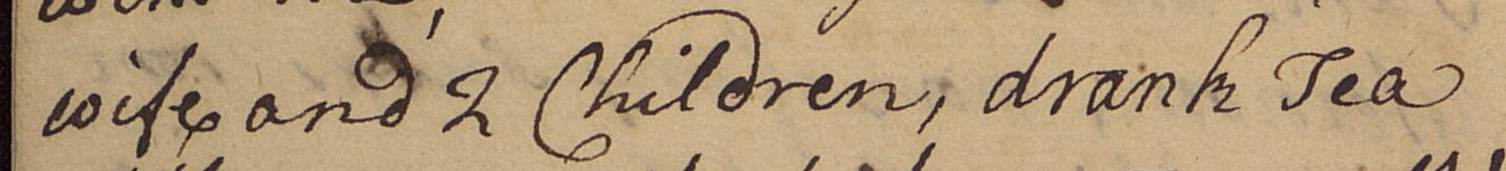wife and 2 Children, drank Tea
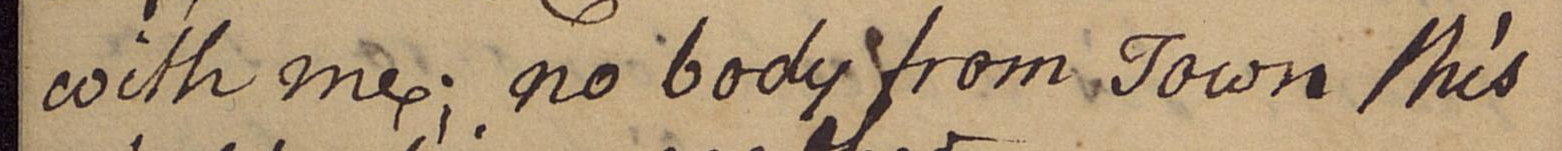with me; no body from Town this
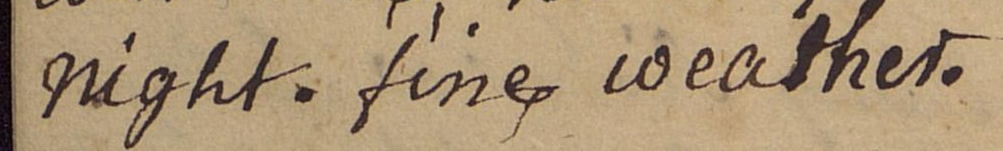night. fine weather.
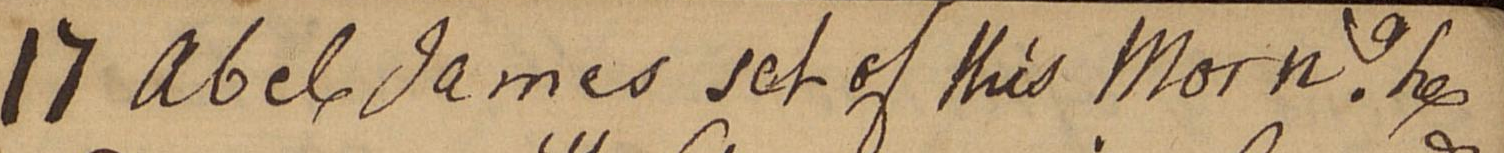17 Abel James set of this Morn^g. he
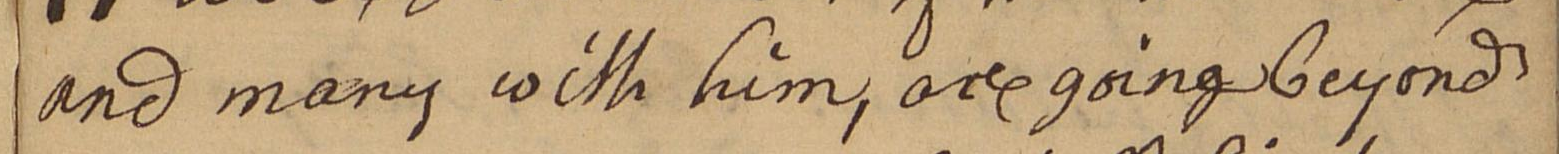and many with him, are going beyond
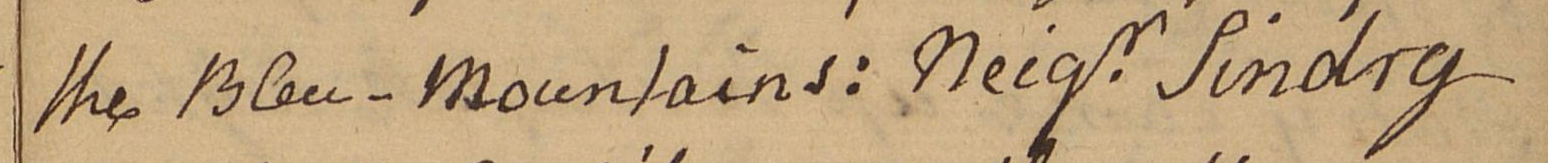the Bleu-Mountains: Neig^r Sindrg
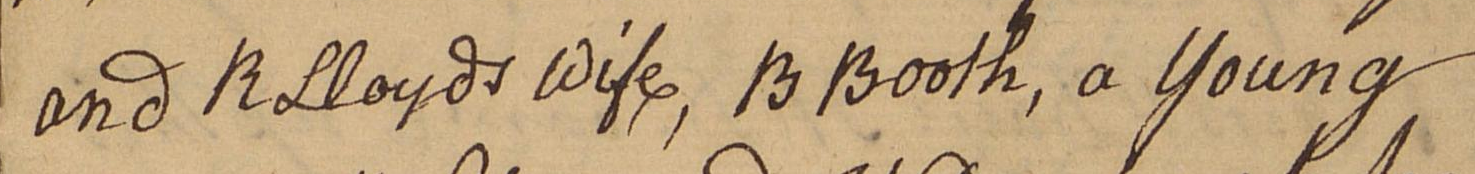and R Lloyds Wife, B Booth, a Young
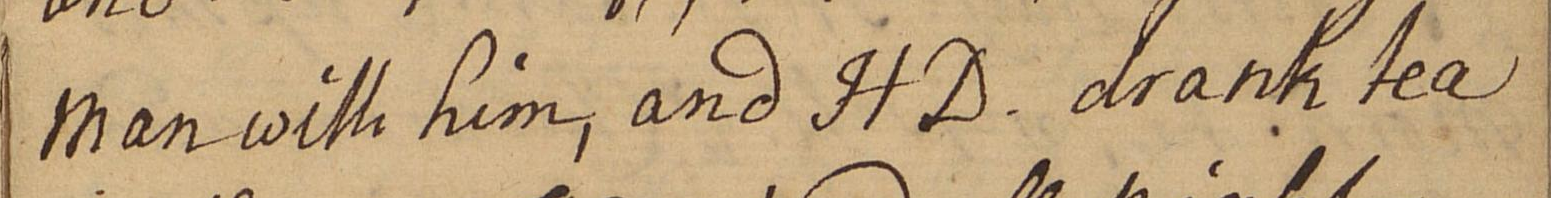Man with him, and H D. drank tea
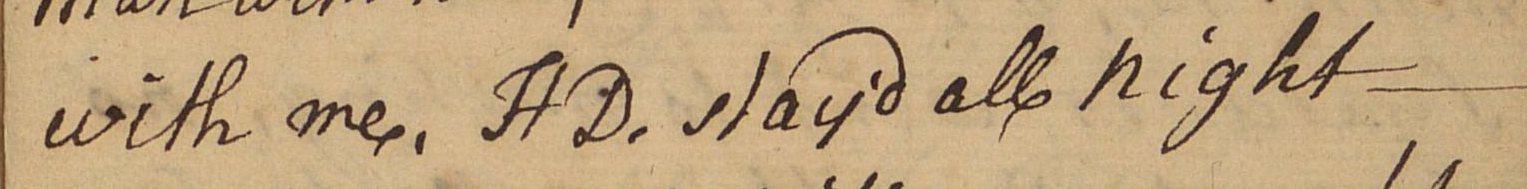with me, H D. stay'd all night-
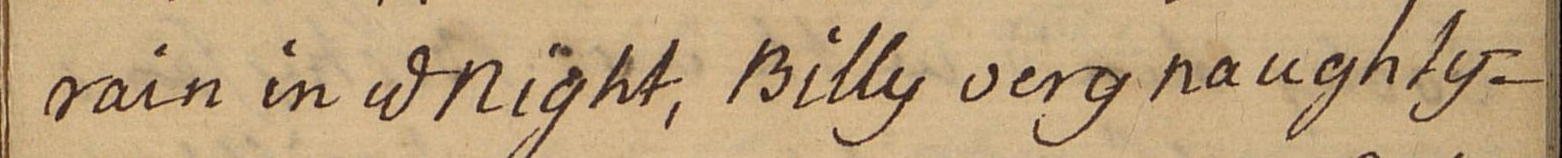rain in y^e Night, Billy very naughty-
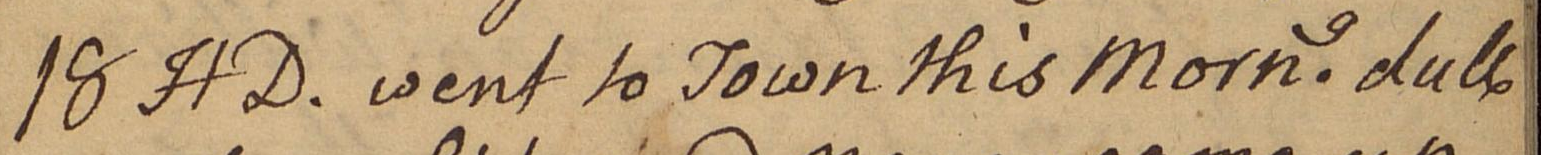18 H D. went to Town this morn^g. dull
